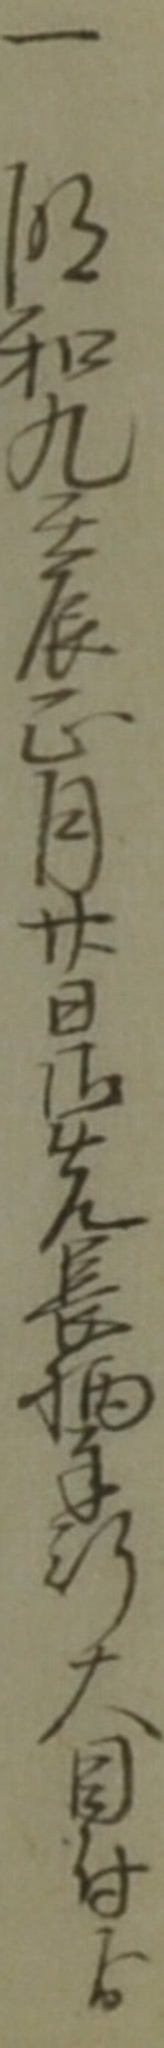一明和九壬辰正月廿日御先長柄奉行大目付ゟ
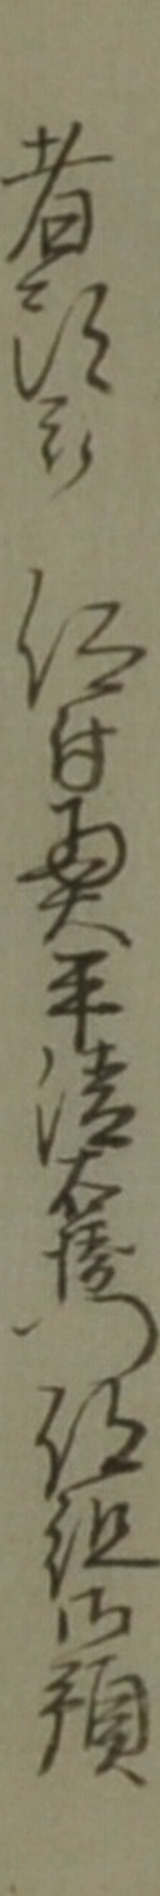者頭被仰付奥平清右衛門跡組御預
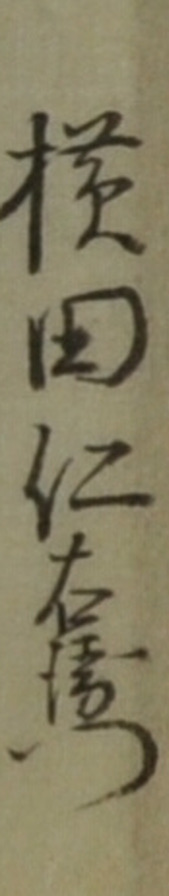横田仁右衛門
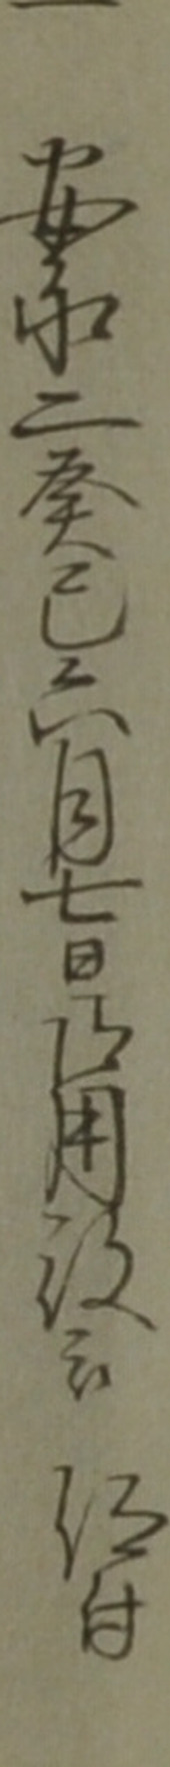一安永二癸巳六月七日御用役被仰付
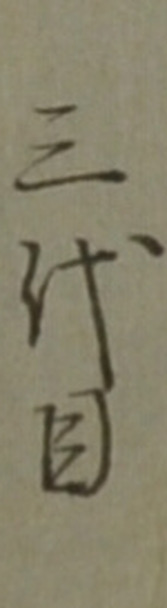三代目
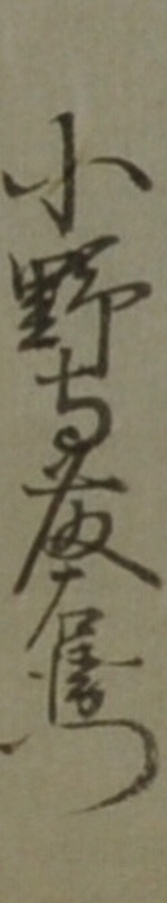小野寺藤右衛門
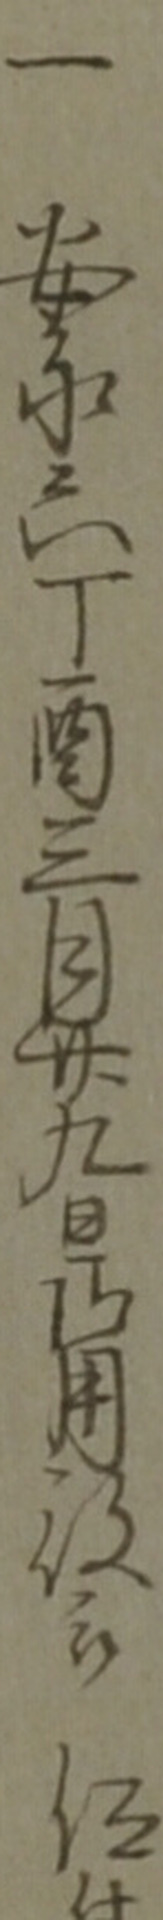一安永六丁酉三月廿九日御用役被仰付
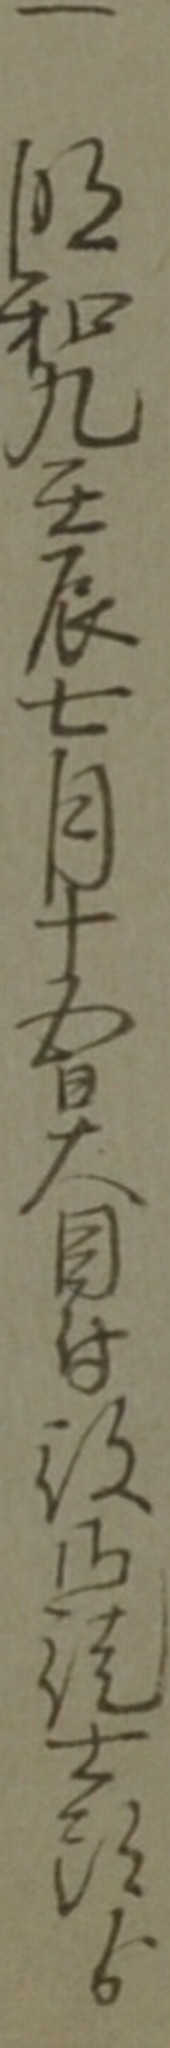一明和九壬辰七月十五日大目付役御徒士頭ゟ
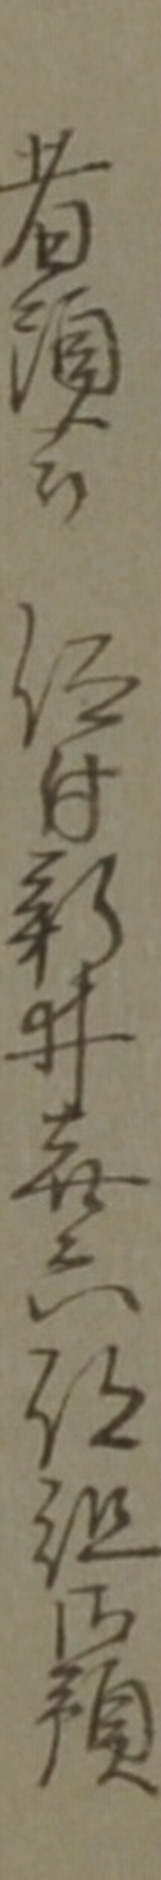者預被仰付新井喜六跡組御預
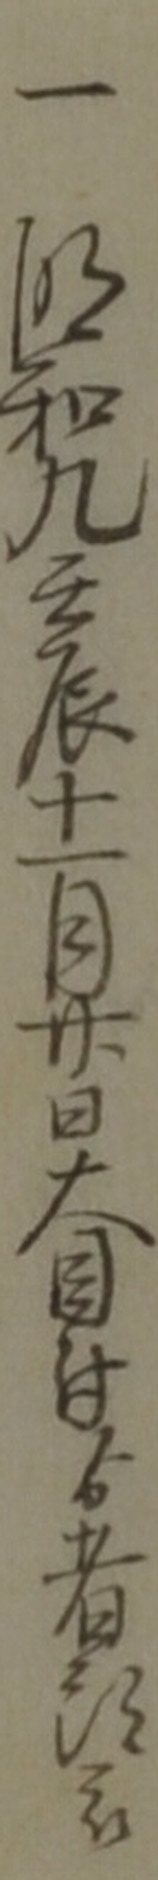一明和九壬辰十一月廿日大目付ゟ者頭被
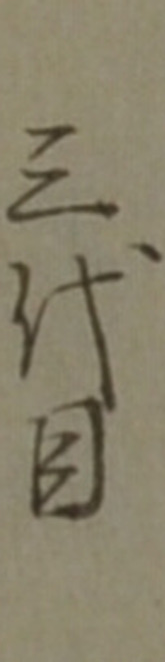三代目
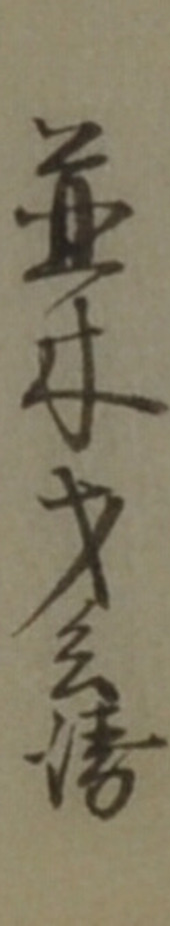並木才兵衛
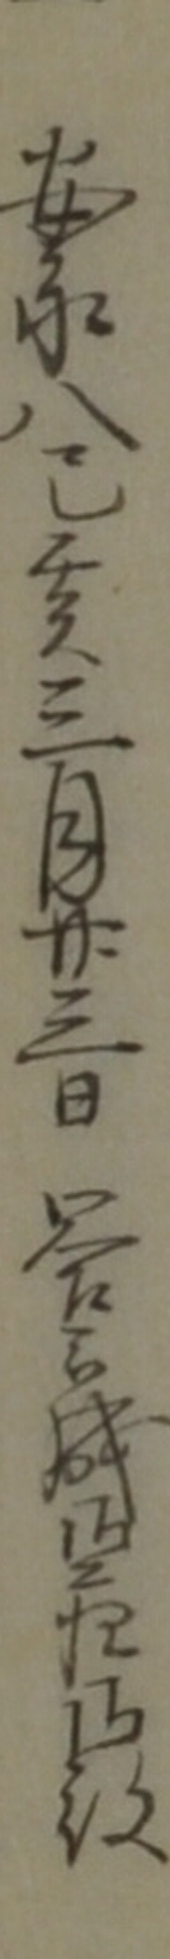一安永八己亥三月廿三日思召被成御座御役
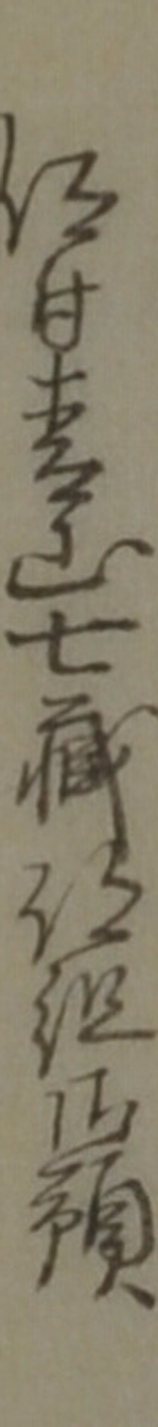仰付青山七蔵跡組御預
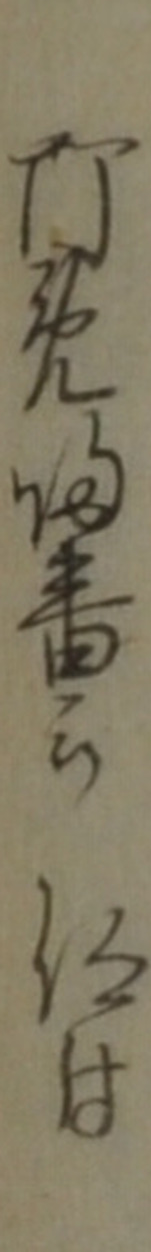御免帰番被仰付
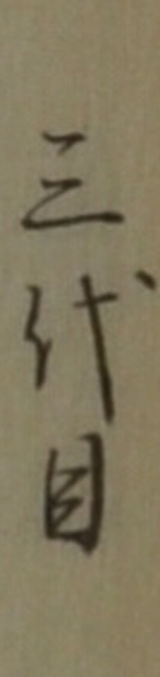三代目
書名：諸御役代々録（二）
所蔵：伊那市立高遠町図書館・合同会社AMANE
